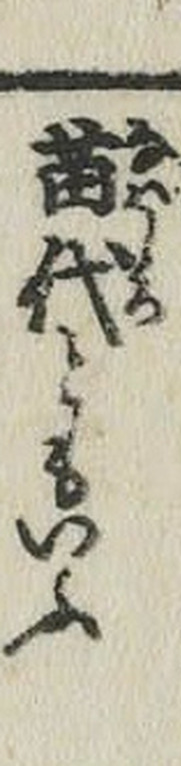苗代ともいふ
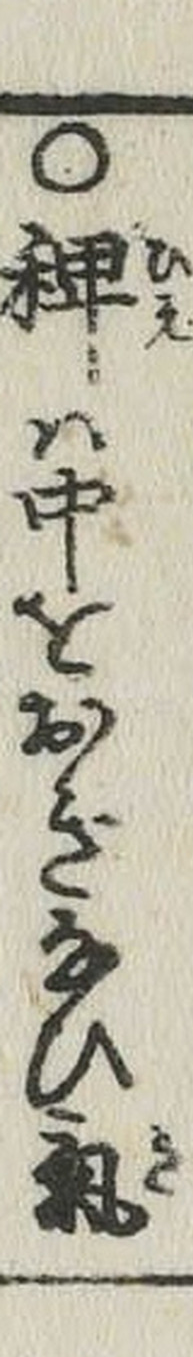○稗は中をおぎなひ気
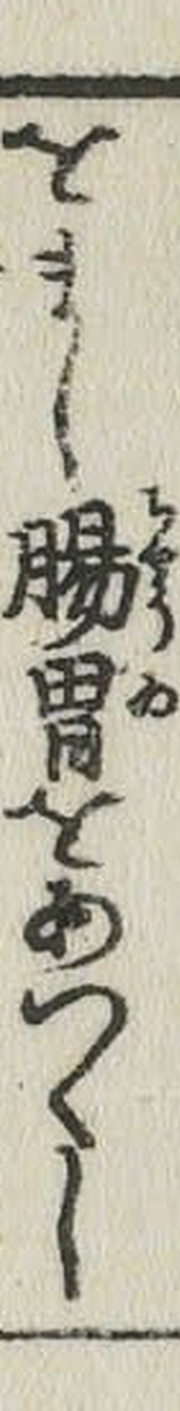をまし腸胃をあつくし
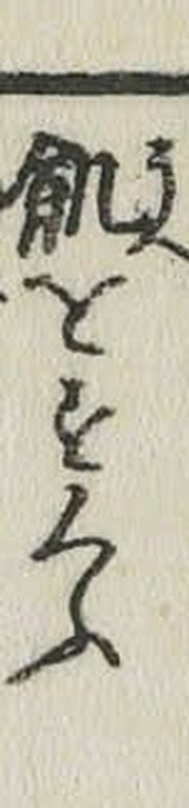飢をすくふ
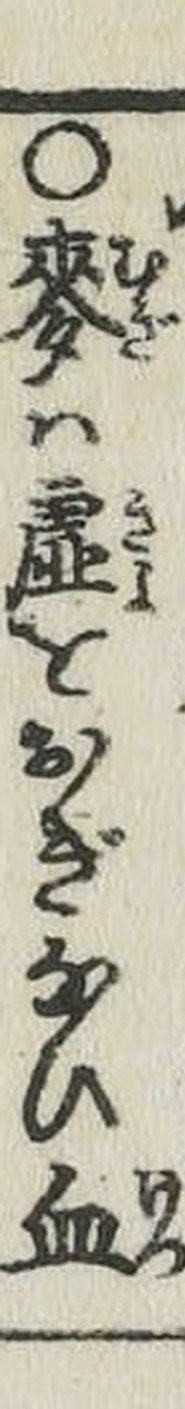○麦は虚をおぎなひ血
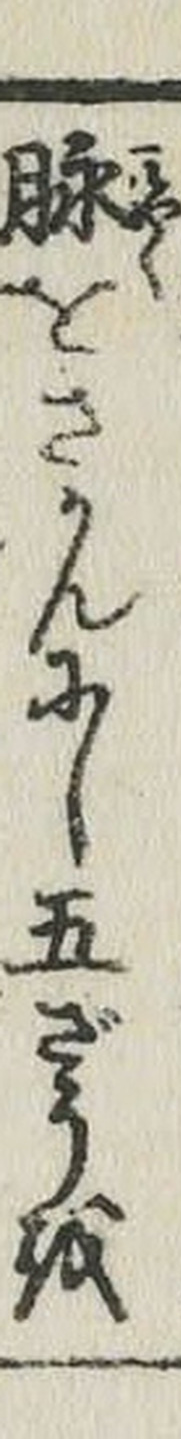脈をさかんにし五ざうを
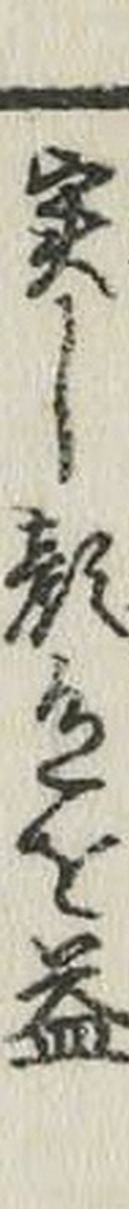実し顔色を益
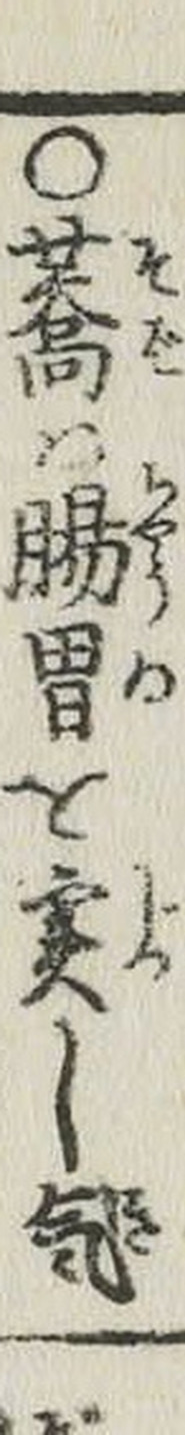○蕎は腸胃を実し気
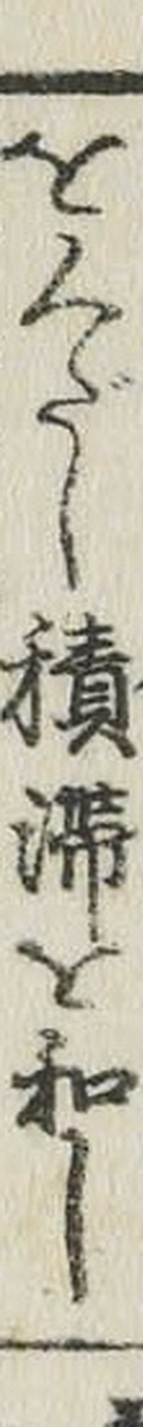をくだし積滞を和し
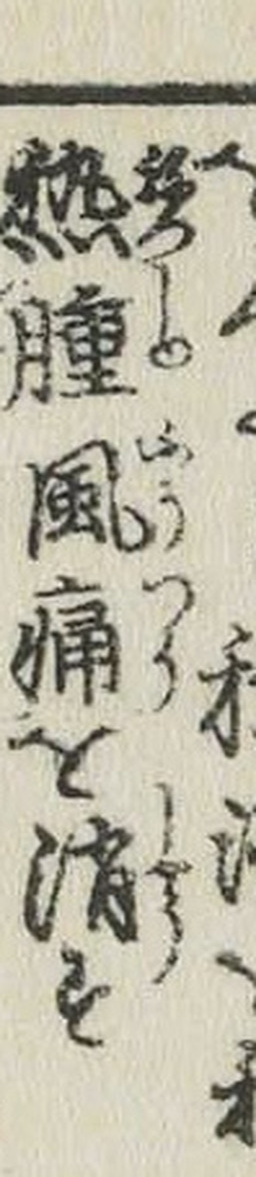熱腫風痛を消す
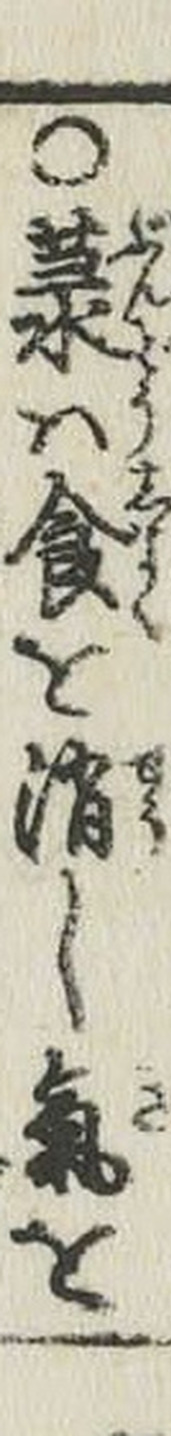○菉は食を消し気を
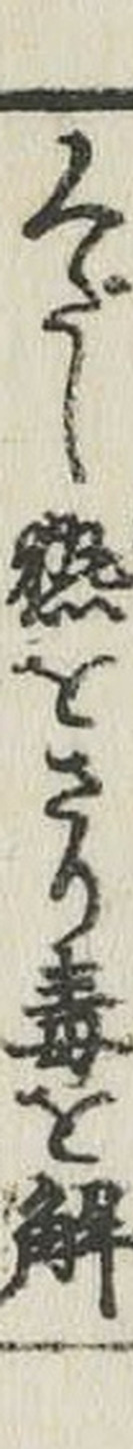くだし熱をさり毒を解
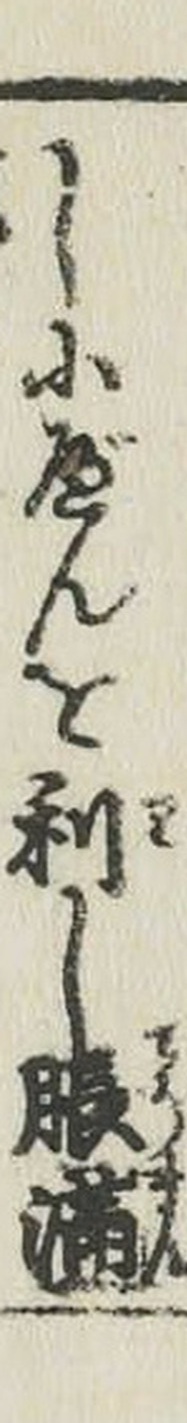し小べんを利し脹満
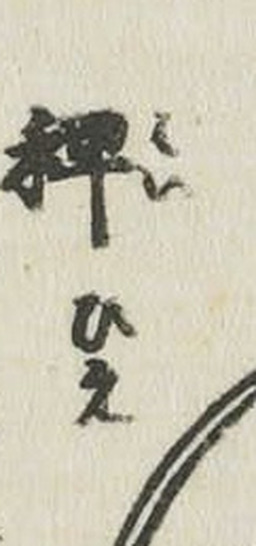稗ひえ
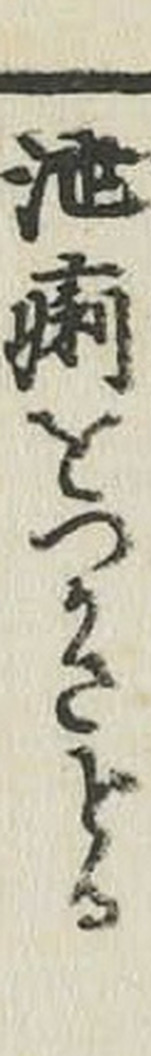泄痢をつかさどる
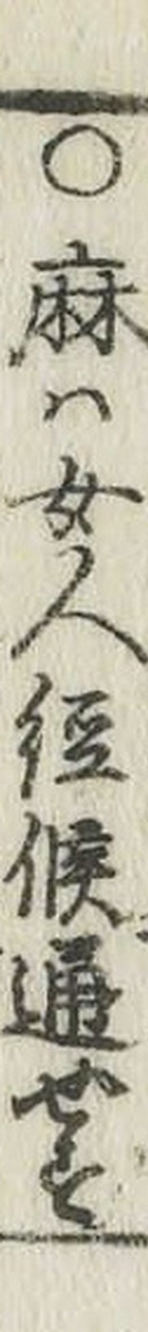○麻は女人経候通ぜす
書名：増補頭書訓蒙図彙大成 10巻 7:巻之14-16
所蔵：東京学芸大学教育コンテンツアーカイブ
